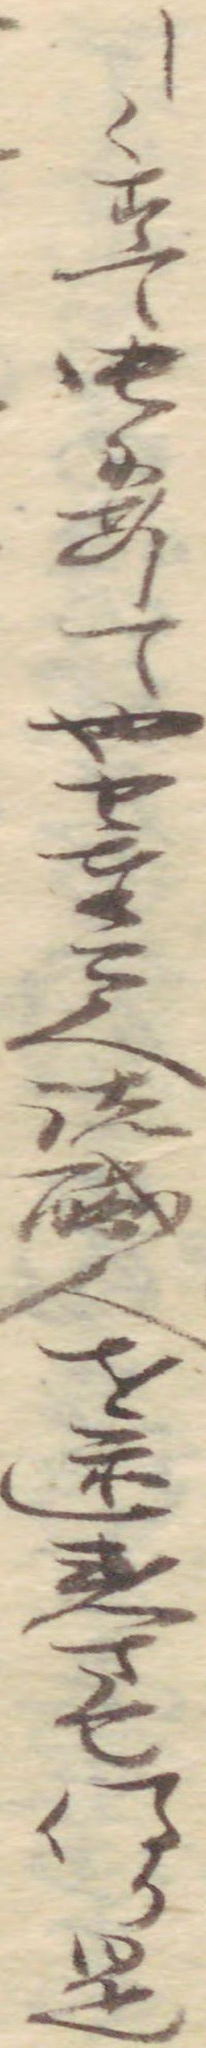しくすて虫になしてやせ奉公人諸職人を迷惑させ侍り是
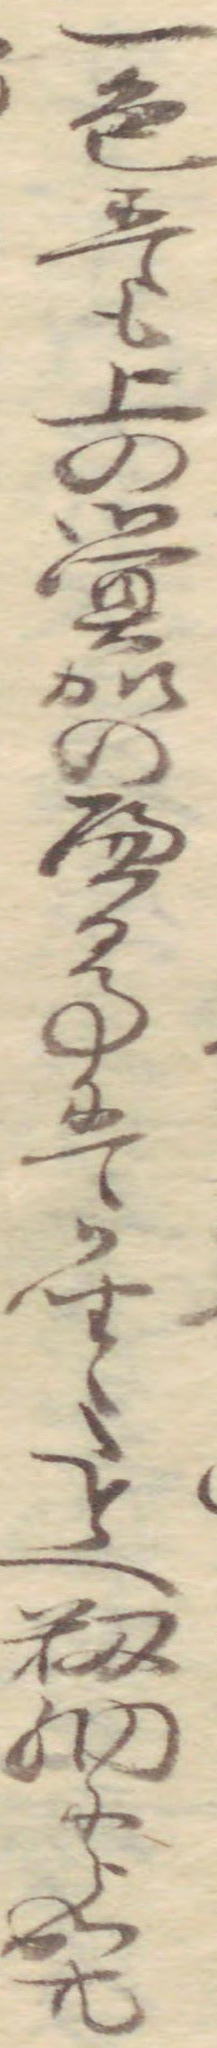一色にても上の御冥加のへる事にて御座候たとへ籾納に被成共
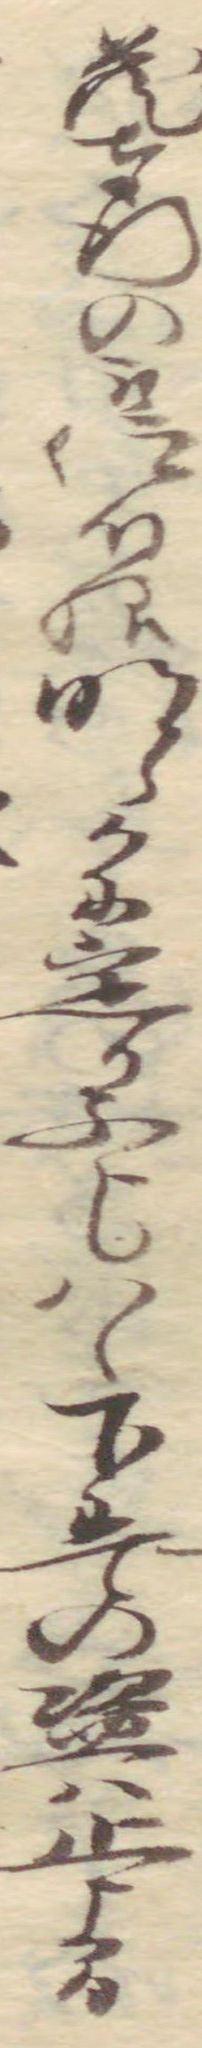蔵奉行の被仰付様明らかに定り不申候はゝ下にての盜は止申間
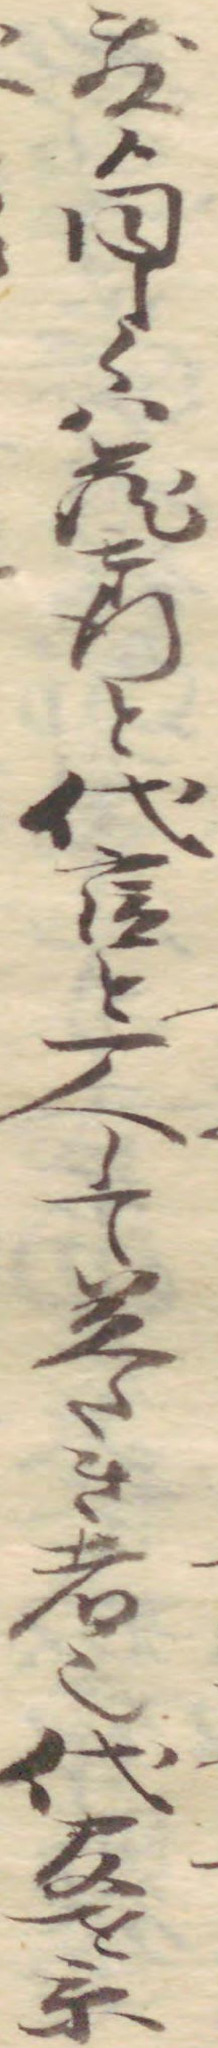敷候同しくは蔵奉行と代官と一人にて兼たき物也代官を京
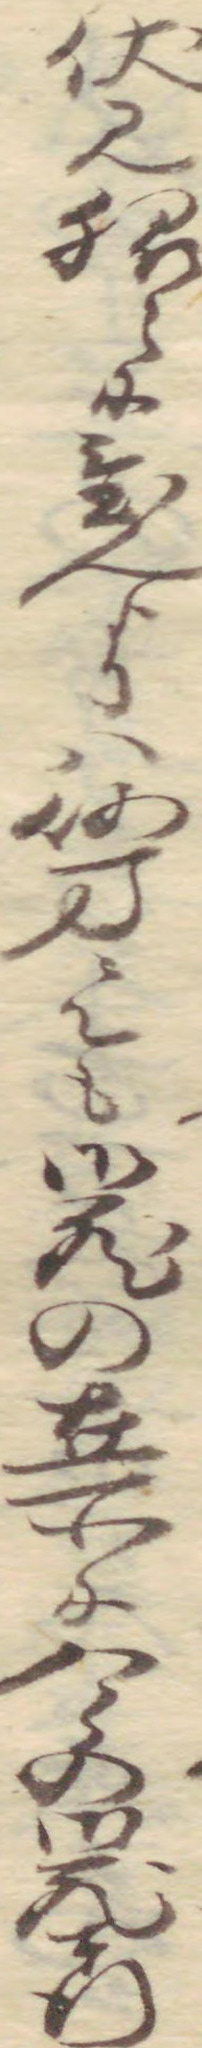伏見脇〻に置んよりは何方ニても御蔵の在所に今の御蔵奉行
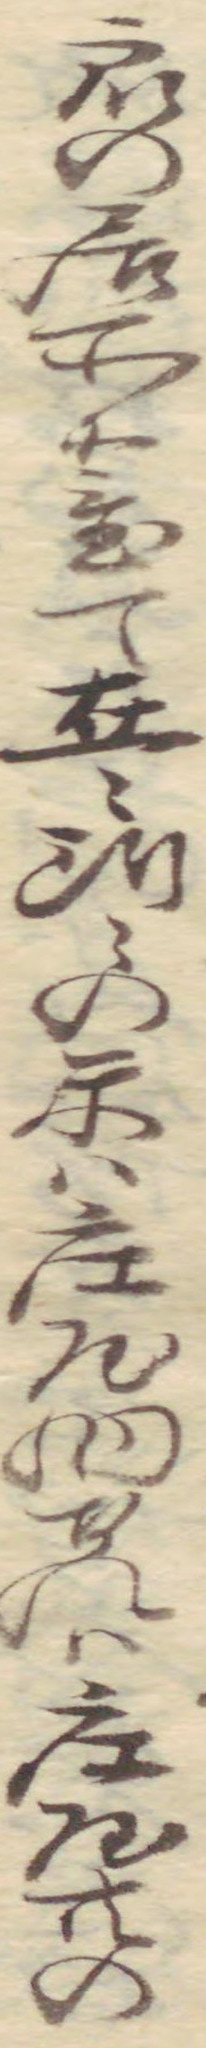衆の居所に置て在〻所〻の米は庄屋納なれは庄屋共の
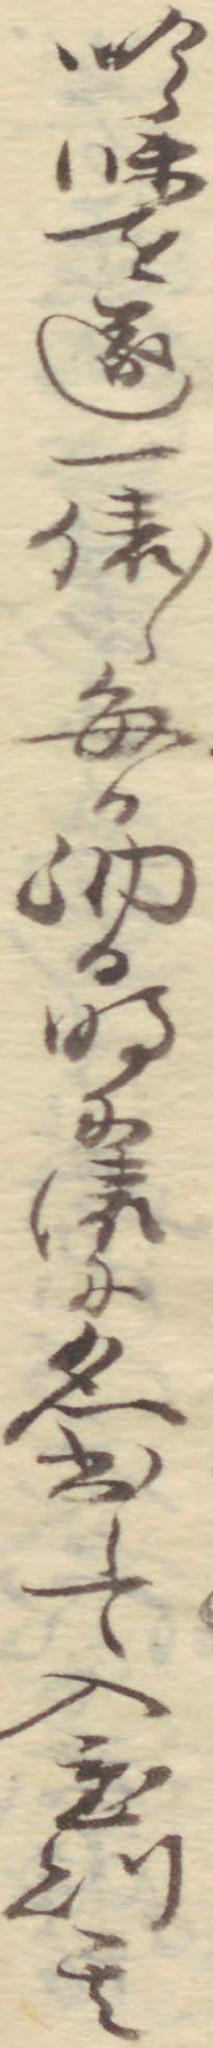吟味を遂一俵〳〵毎日納る時に俵に名書して入置則其
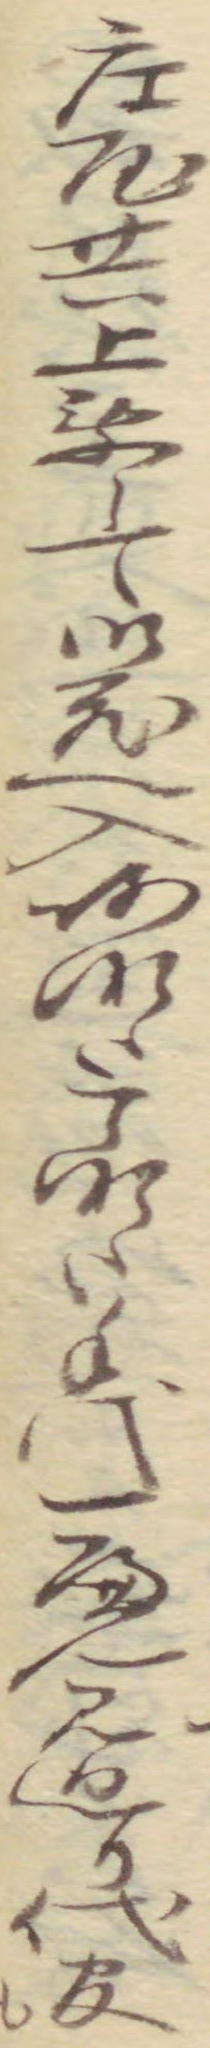庄屋共上乗にて御蔵へ入あなたこなた手代一へん見廻り代官も
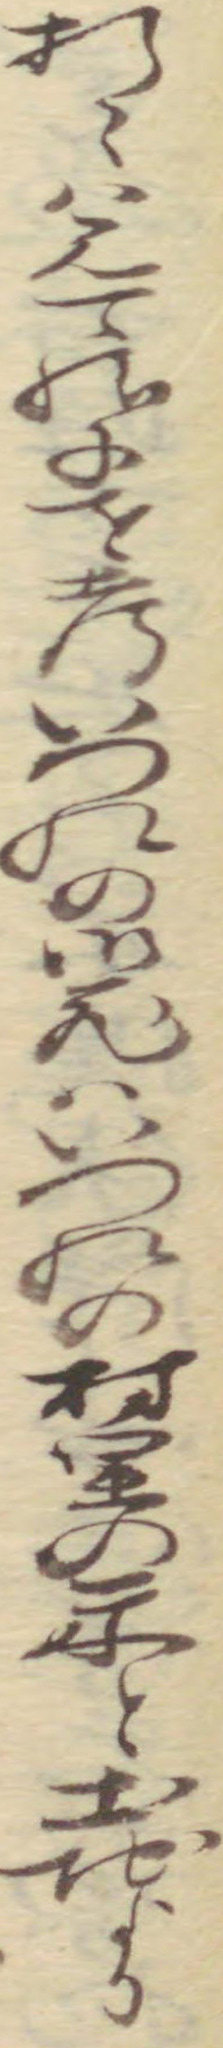折〻は見て様子を考いつれの御蔵はいつれの村里の米と土地より
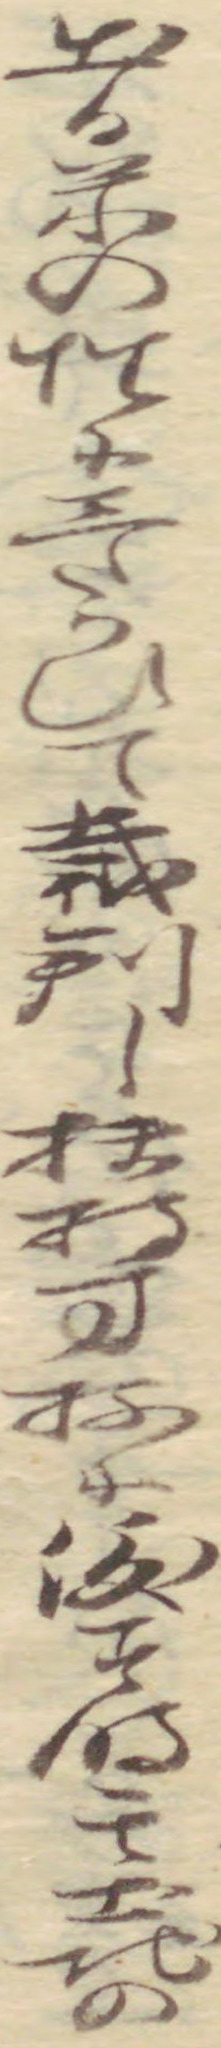出る米の性にしたかひて裁判し扶持方抔に渡す時其土地の
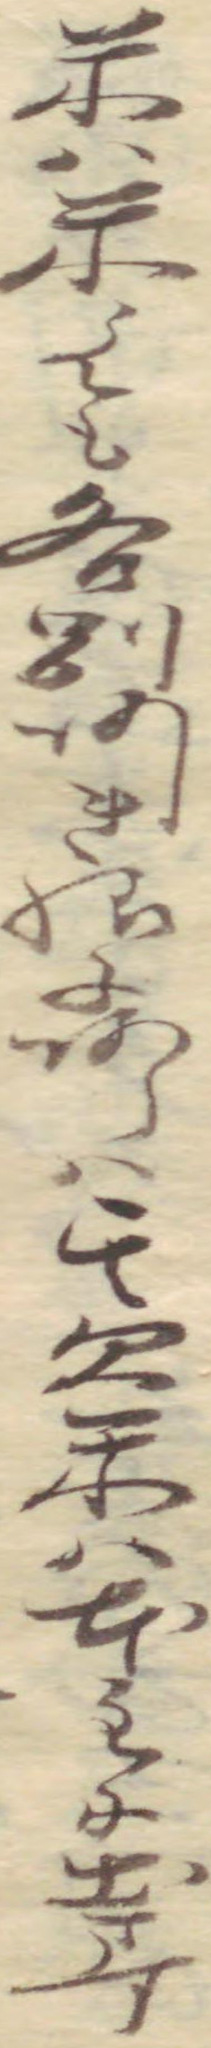米は米ニても格別あしき様子あらは其欠米は本主に出さす
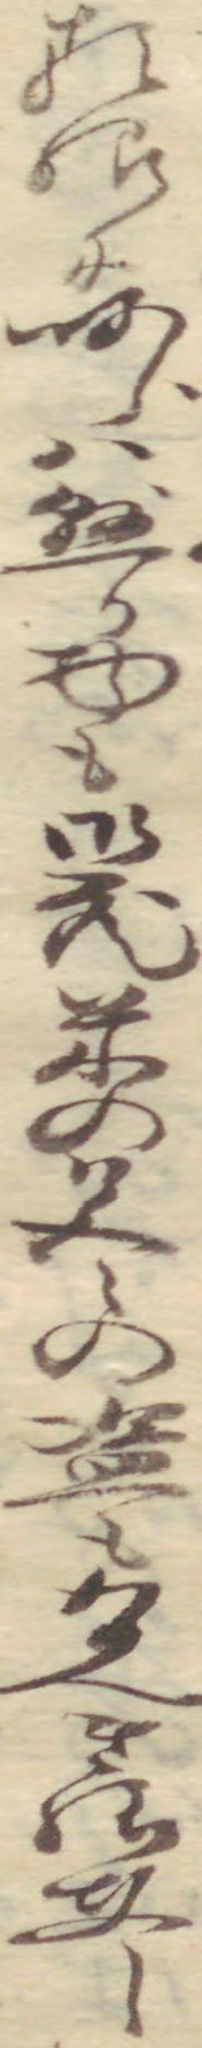る様にあらは懸り物も御蔵米の色〻の盜も有へき様なし
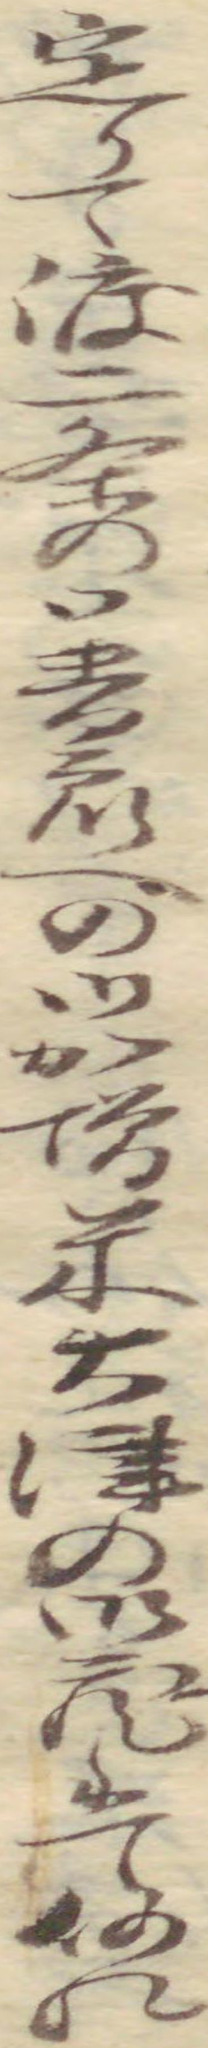定りて渡二条の御番衆への御加増米大津の御蔵にて何れ
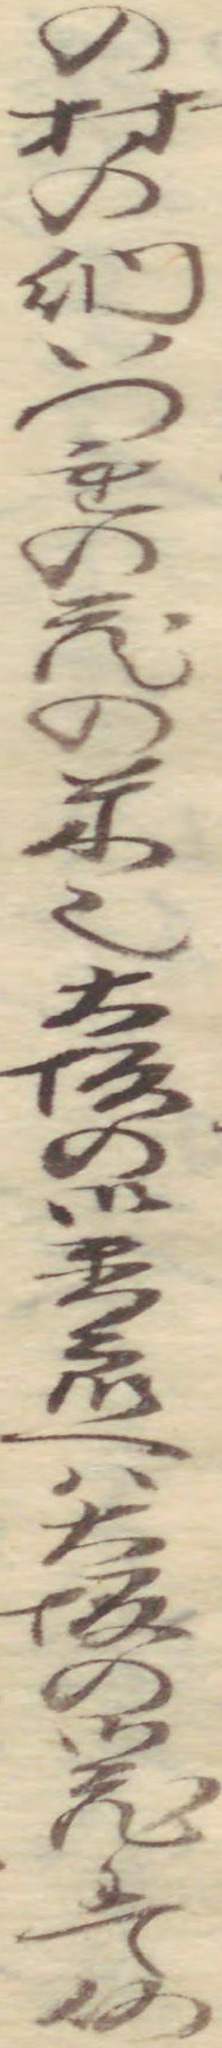の村の納いつれの御蔵の米也大坂の御番衆へは大坂の御蔵にて何
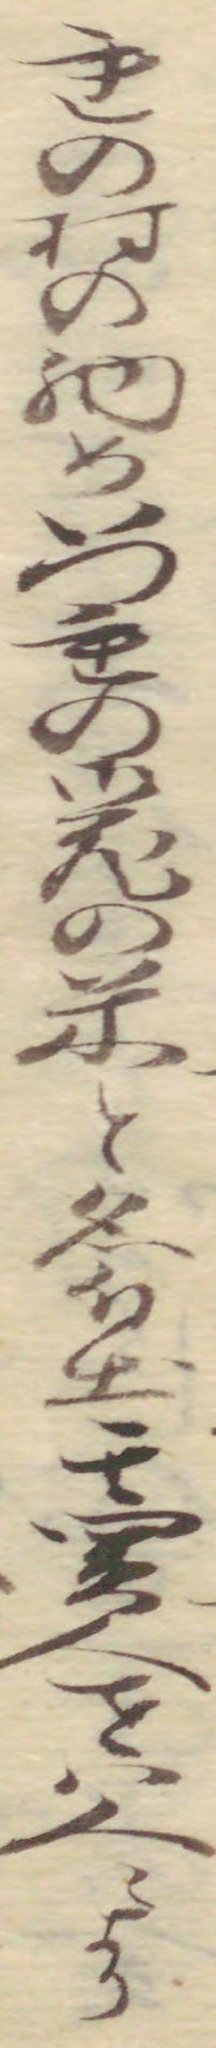れの村の納めいつれの御蔵の米と名付出其買人をは人〻より
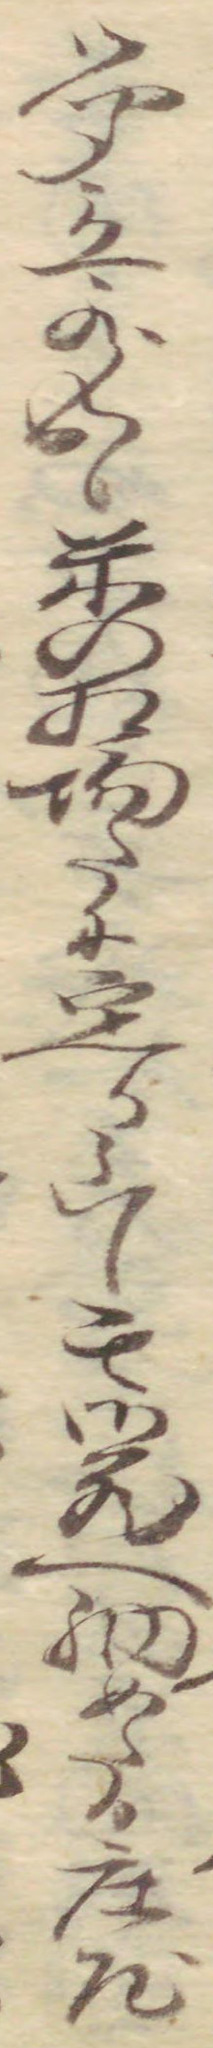御聞立可被成候米の相場たに定り候はゝ其御蔵へ納めたる庄屋
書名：鶯宿雑記. 巻263-264
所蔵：国立国会図書館 National Diet Library, JAPAN
